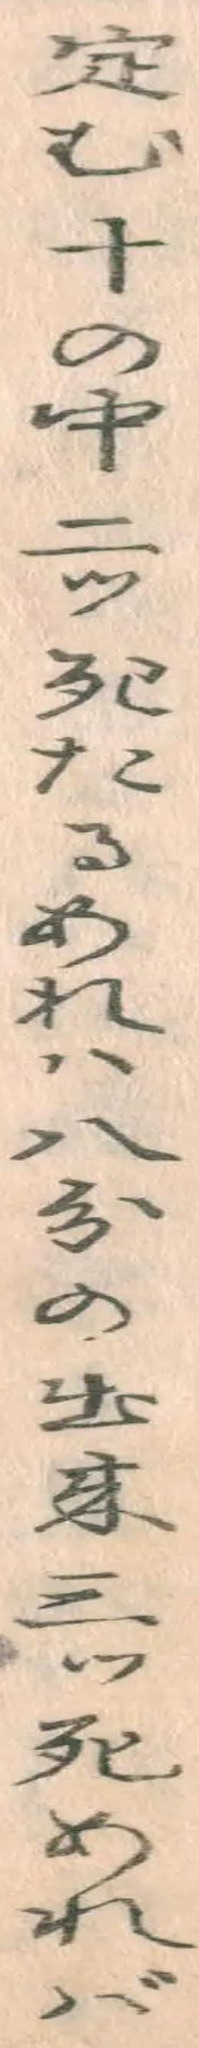定む十の中二ッ死たるあれは八分の出来三ッ死あれば
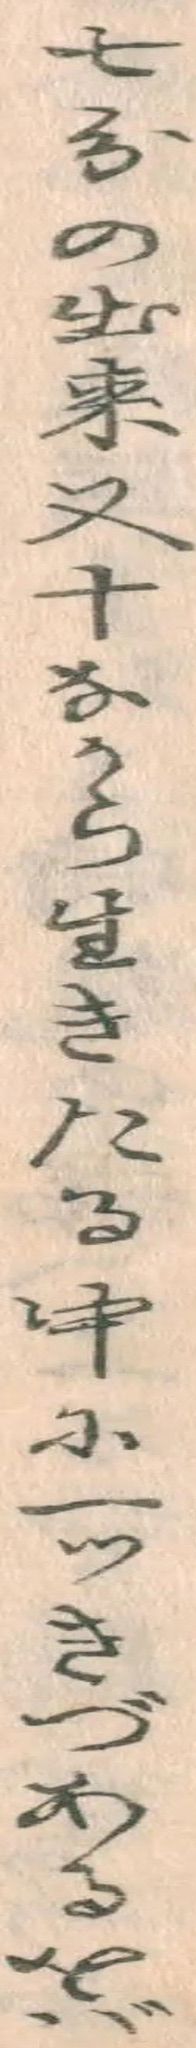七分の出来又十なから生きたる中に一ッきづあるをば
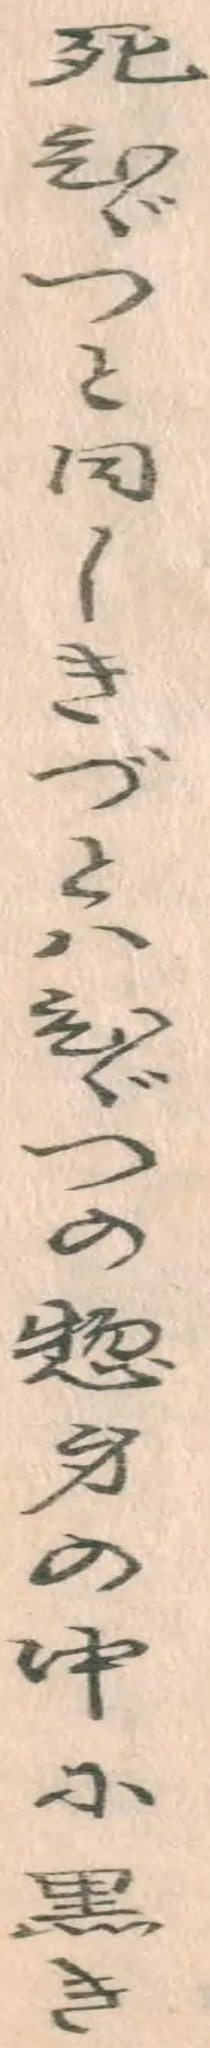死ひゞつと同しきづとはひゞつの惣身の中に黒き
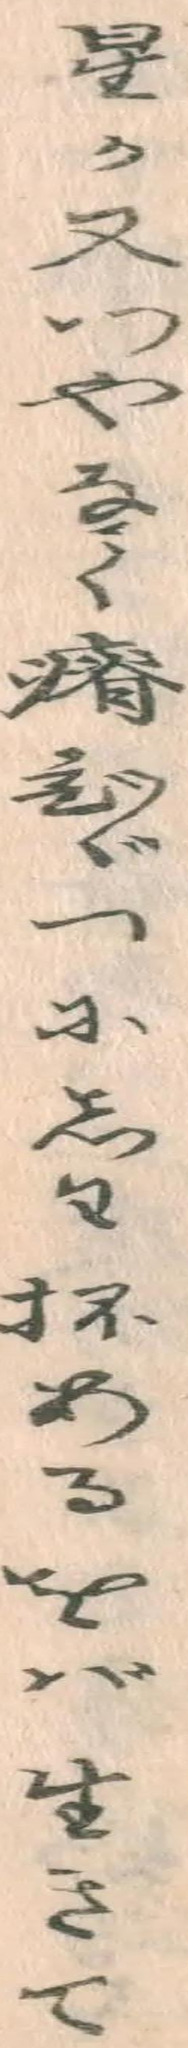星か又つやなく瘠ひゞつにしわ抔あるをば生きて
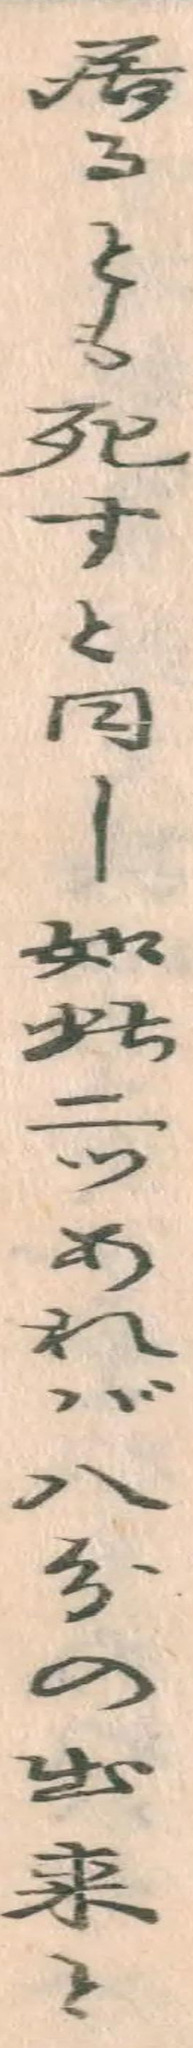居るとも死すと同し如此二ッあれば八分の出来と
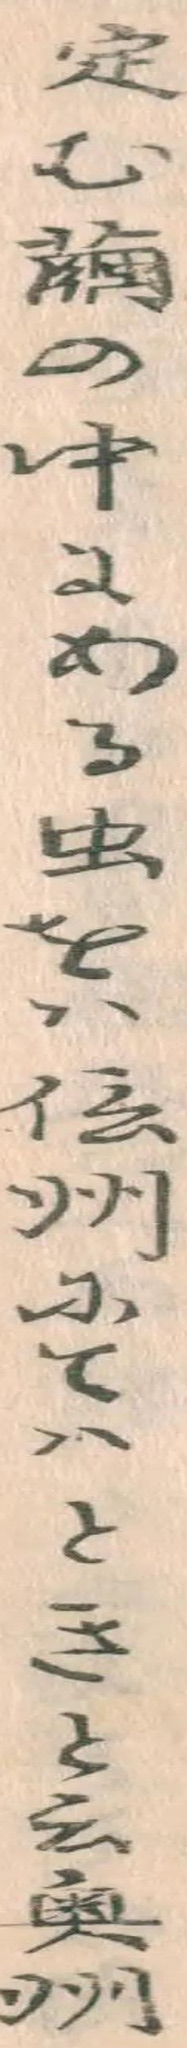定む繭の中にある虫をは信州にてはときと云奥州
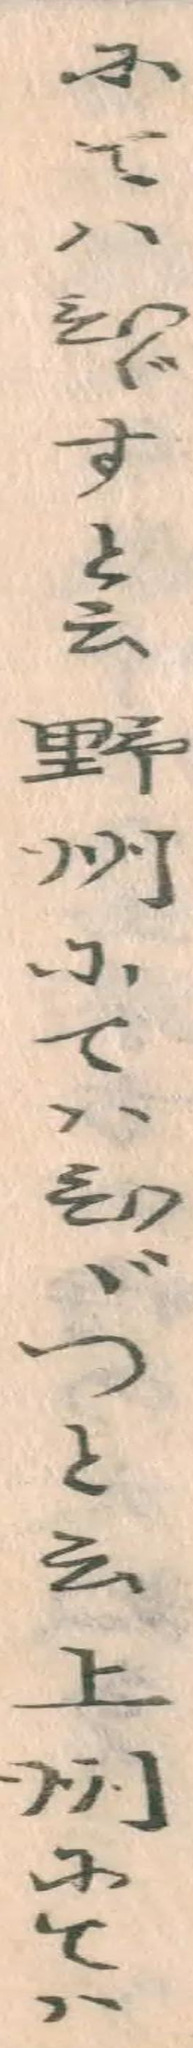にてはひゞすと云野州にてはひゞつと云上州にては
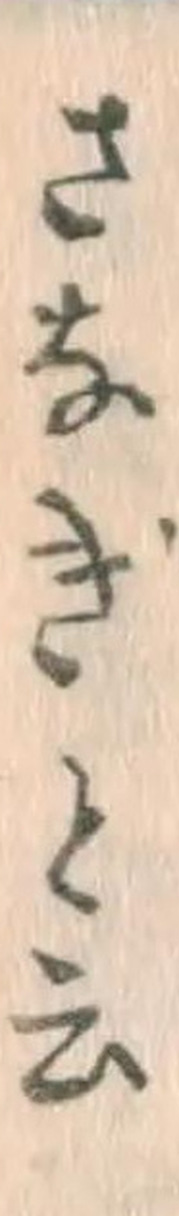さなぎと云
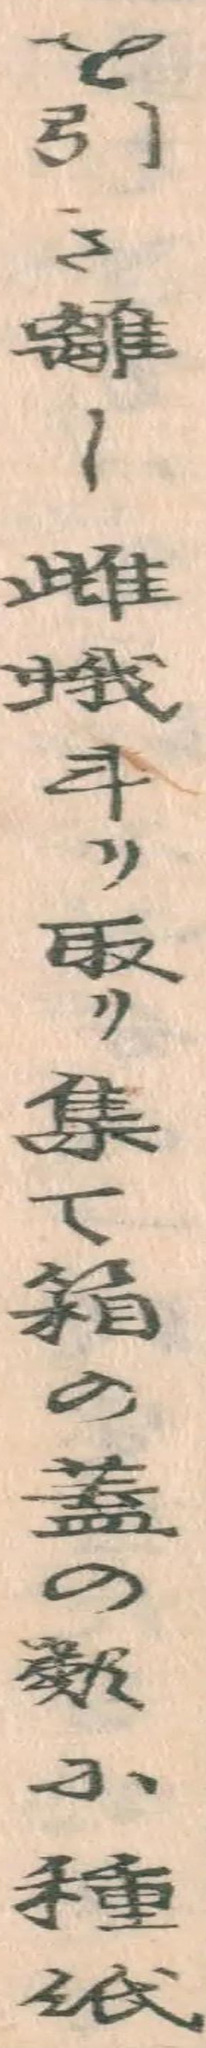を引き離し雌蛾斗り取り集て箱の蓋の類に種紙
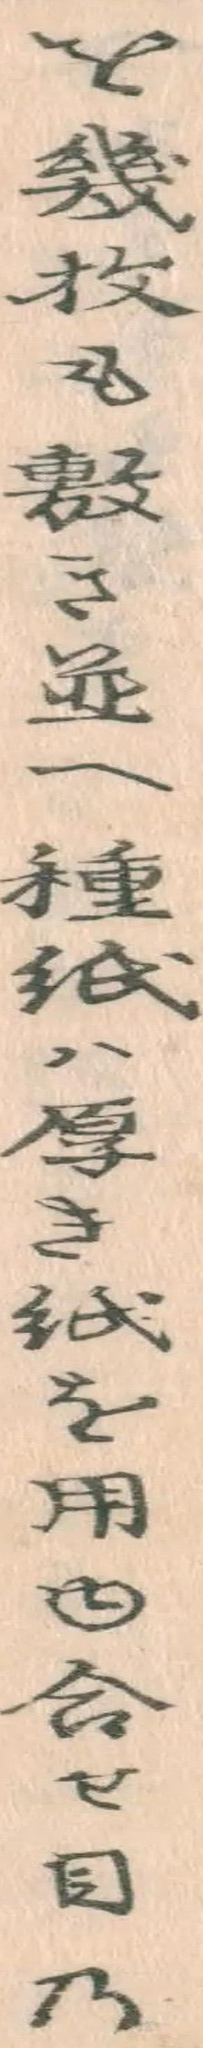を幾枚も敷き並へ種紙は厚き紙を用ゆ合せ目の
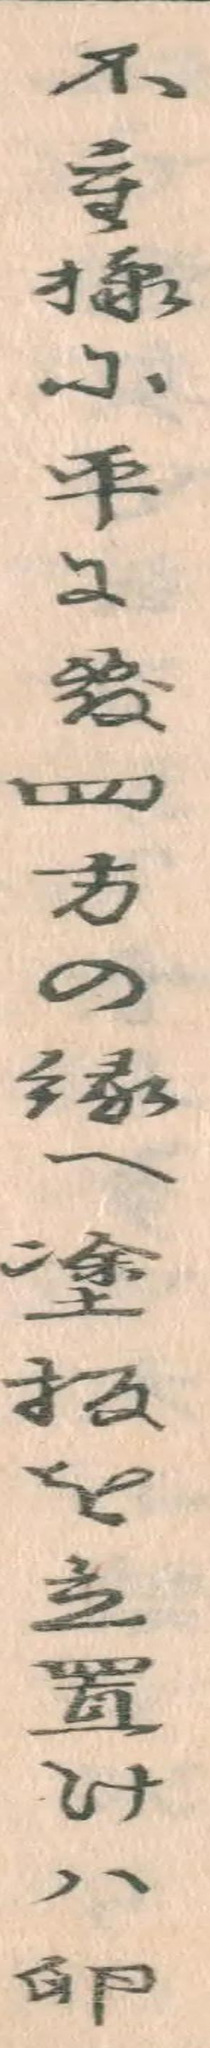不重様に平に敷四方の縁へ塗板を立置けは卵
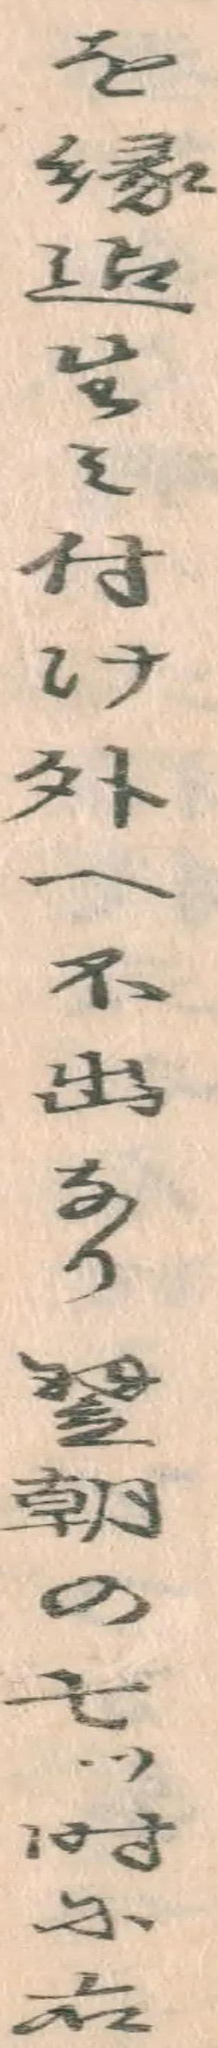を縁迄生み付け外へ不出なり翌朝の七ッ時に右
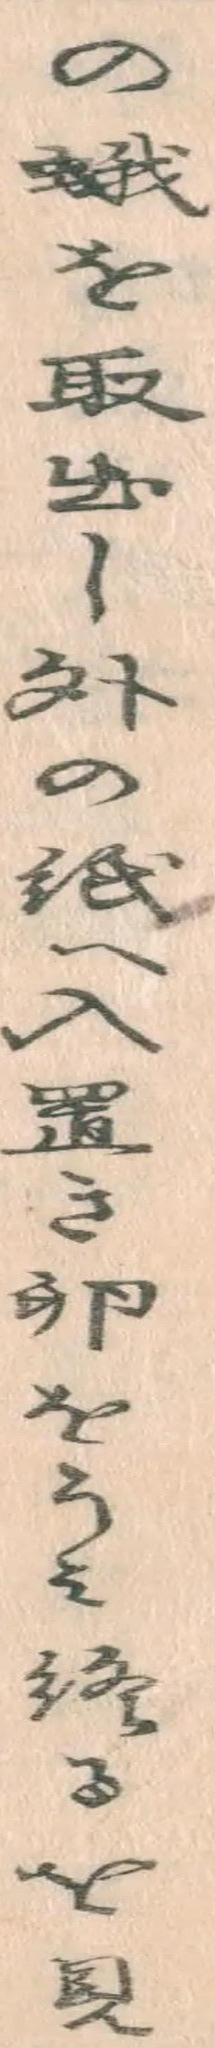の蛾を取出し外の紙へ入置き卵をうみ終るを見
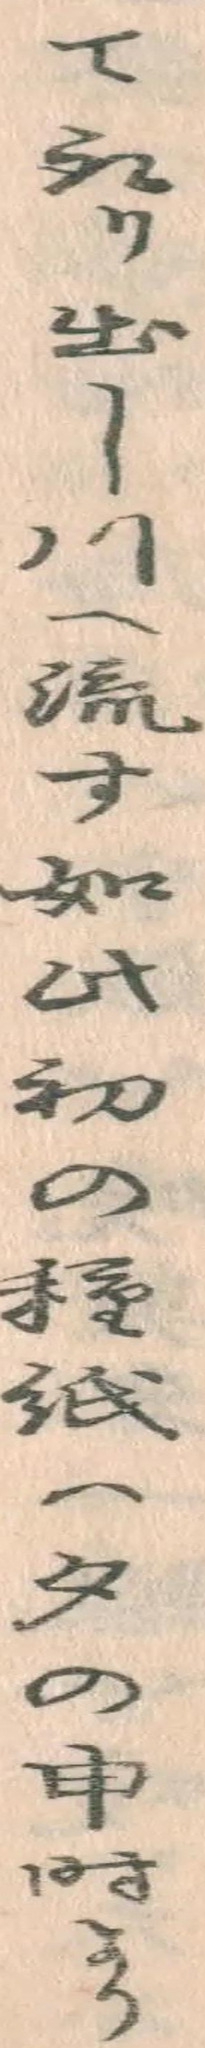て取り出し川へ流す如此初の種紙は夕の申時より
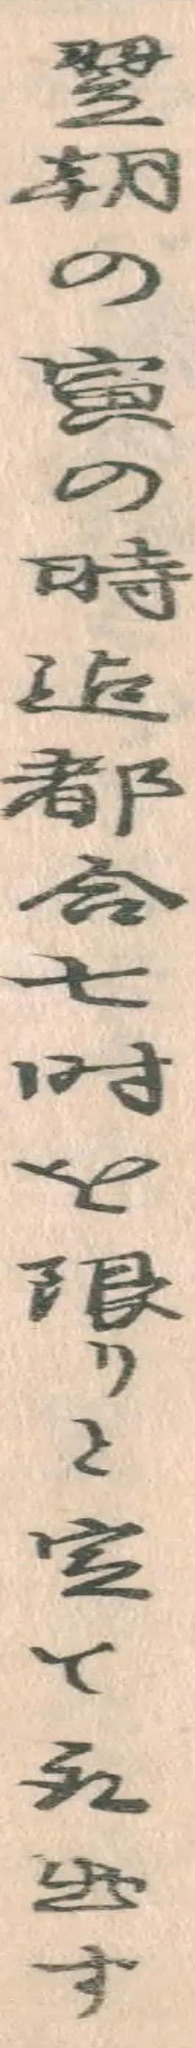翌朝の寅の時迄都合七時を限りと定て取出す
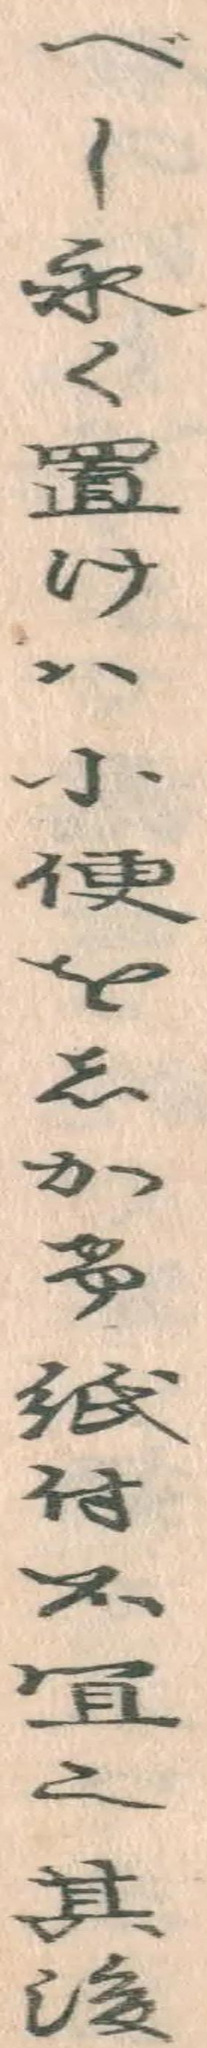べし永く置けは小便をしかけ紙付不宜也其後
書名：機織彙編 5巻. [1]
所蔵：国立国会図書館 National Diet Library, JAPAN
